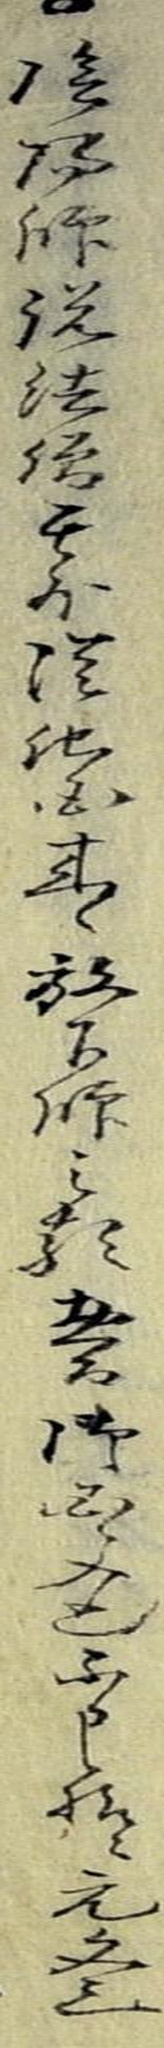〇陰陽師説法僧其外従他国来候放下師之類惣而御国へ入込不申様ニ元文三
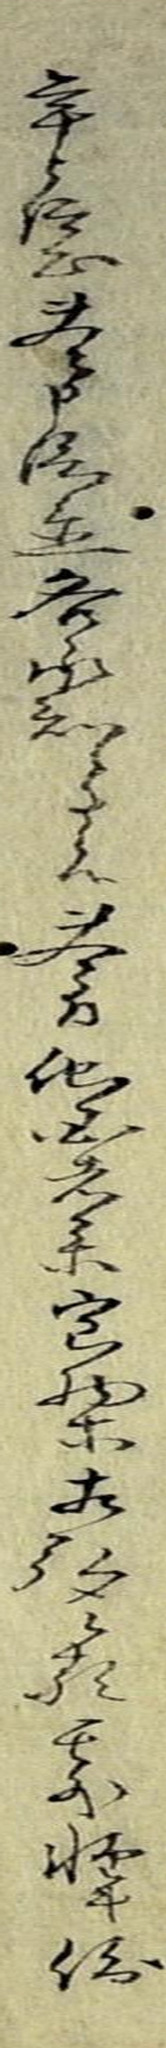年被仰出夫々申渡置各承知之事ニ候夫ニ付他国者参宝物等相弘メ候類其外軽キ儀
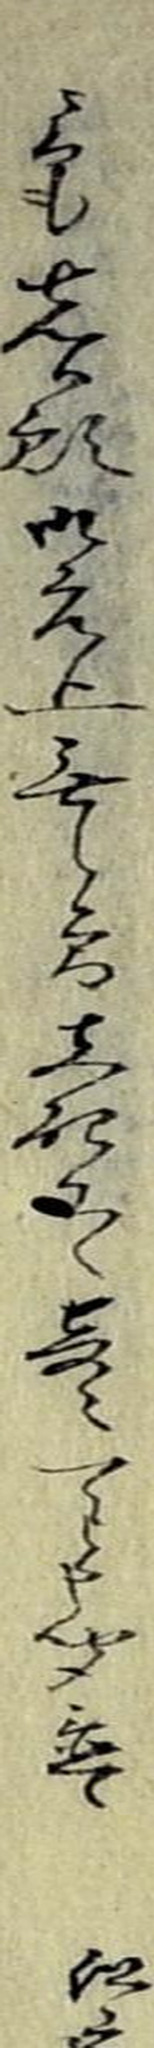ニ而も先ハ願御取上無之候間支配下へ寄々可被申聞置候但府中へも
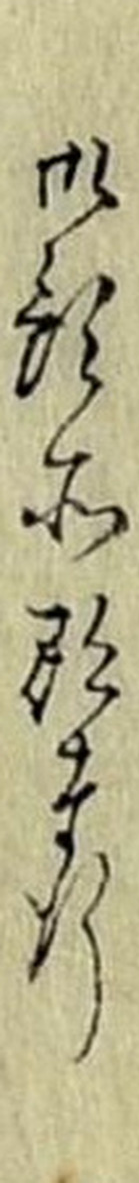御預所郡奉行
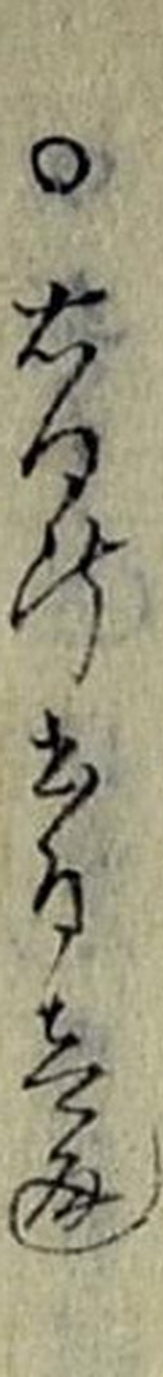〇右同断書付壱通
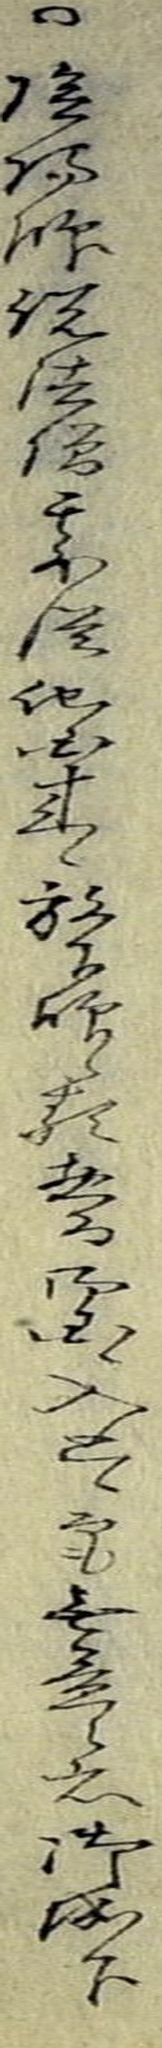〇陰陽師説法僧其外従他国来候放下師之類惣而御国へ入込候而も無益之者御城下
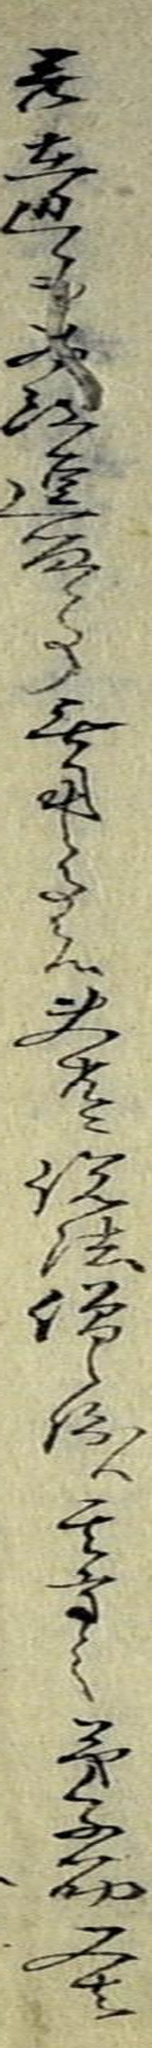并在辺へも為致逗留候事無用之事ニ候夫共ニ説法僧之儀ハ其寺之弟子筋又者
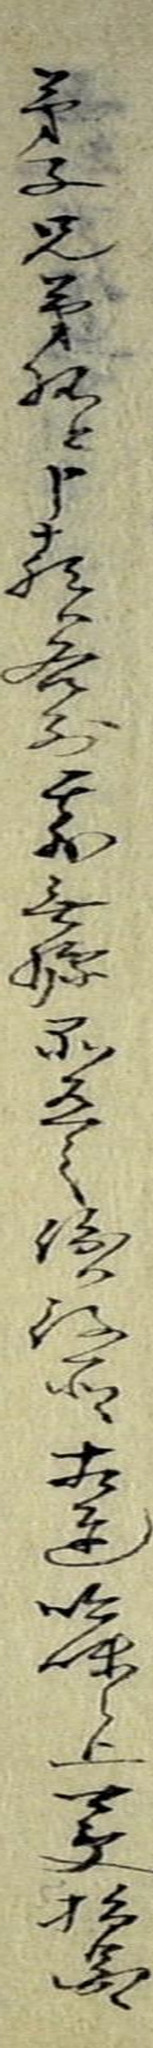弟子兄弟抔と申類ハ各別其外無拠品有之儀ハ役所へ相達吟味之上可受指図候
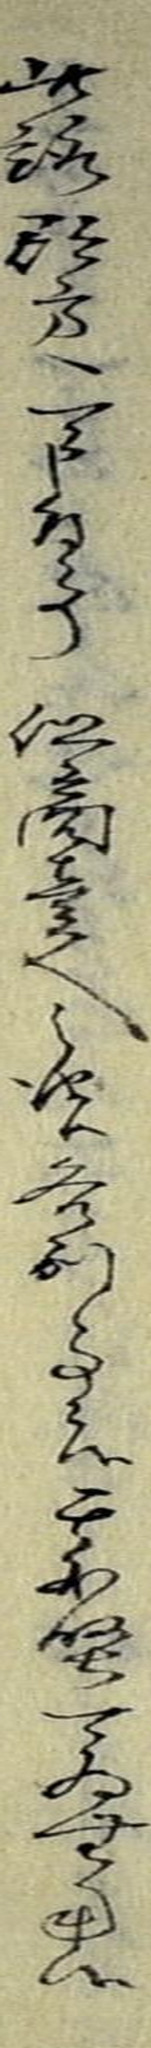此趣郡方へ可申付事但商売人之儀ハ各別之事ニ候其外堅可為無用候
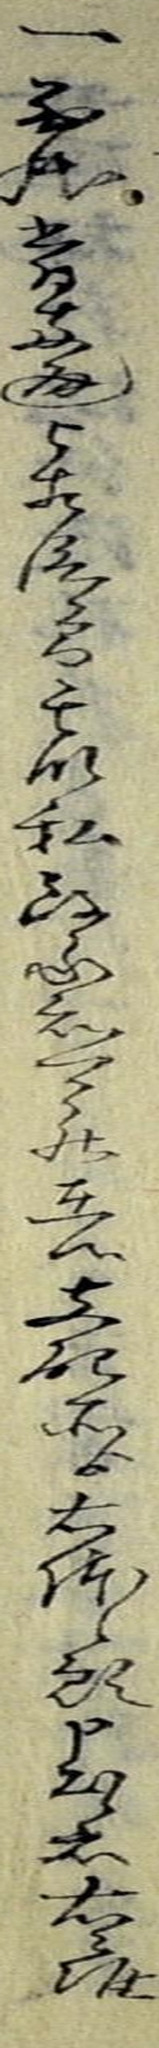一別紙書両通被相渡候間其段私致承知可罷在候支配所ゟ右体之願申出候者右ニ准
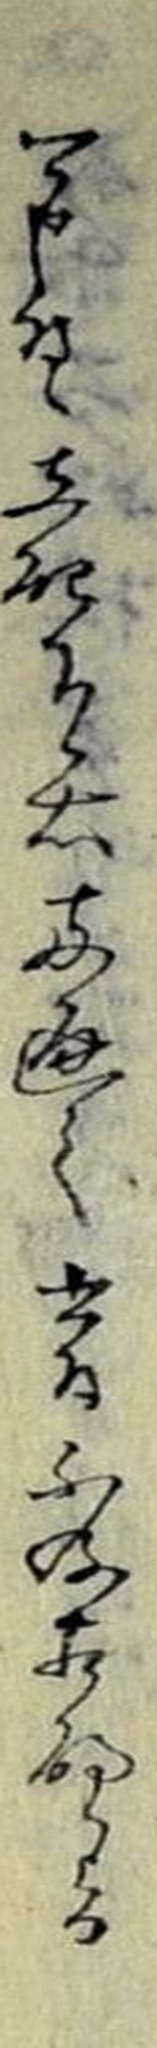可申付候支配下へ右両通之書付不及相触候旨
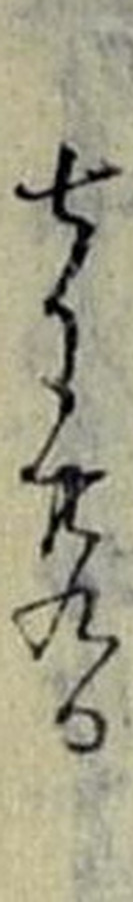七月廿九日
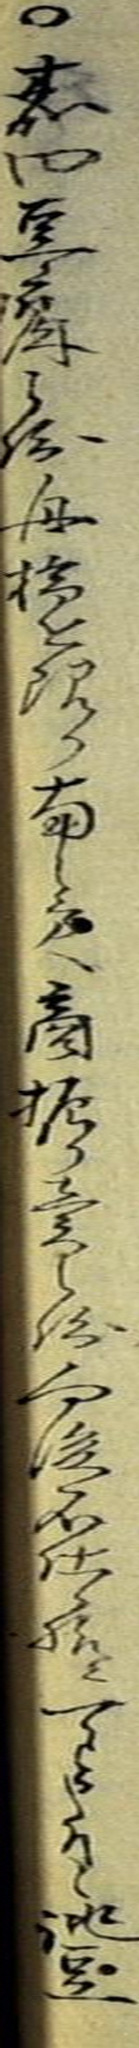〇森田豆腐之儀舟橋を限り南之方へ商振り売之儀向後不仕候様ニ可被申付候誂豆
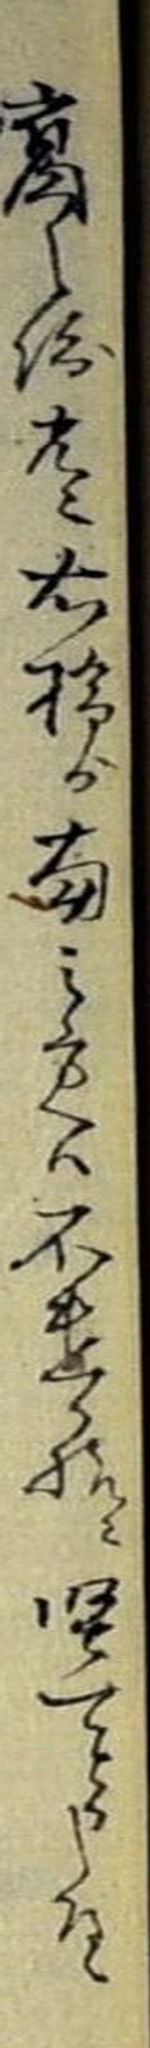腐之儀共ニ右橋ゟ南之方へハ不遣候様ニ堅可被申付候
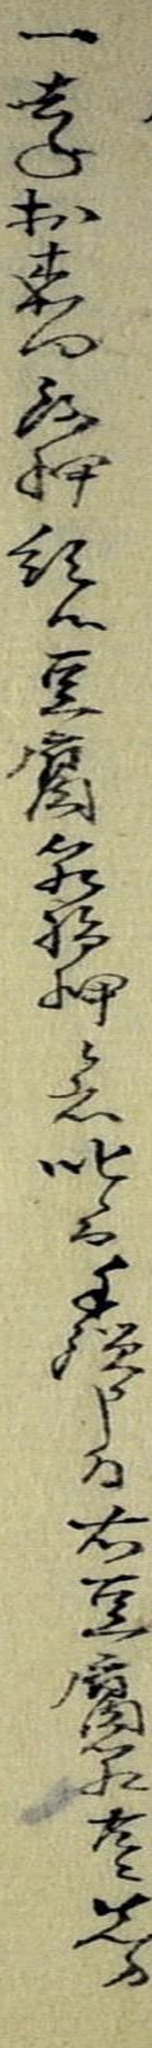一去年於森田致押領候豆腐箱指押候者叱候而手鎖申付右豆腐箱共ニ先方
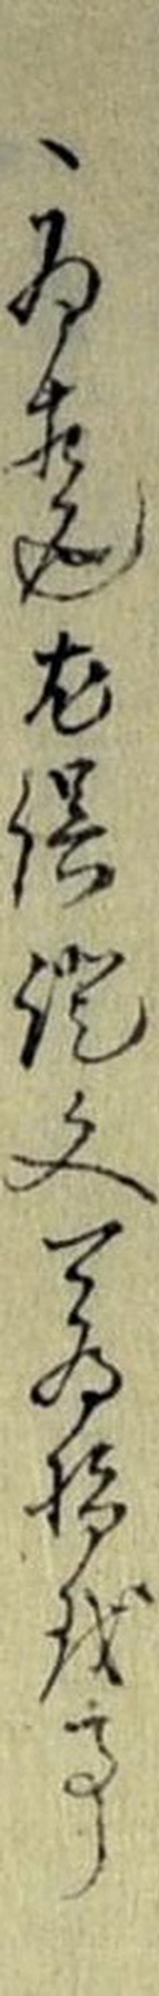へ為相返尤誤証文可為指越事
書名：命令之部 一
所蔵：福井県文書館 Fukui Prefectural Archives
